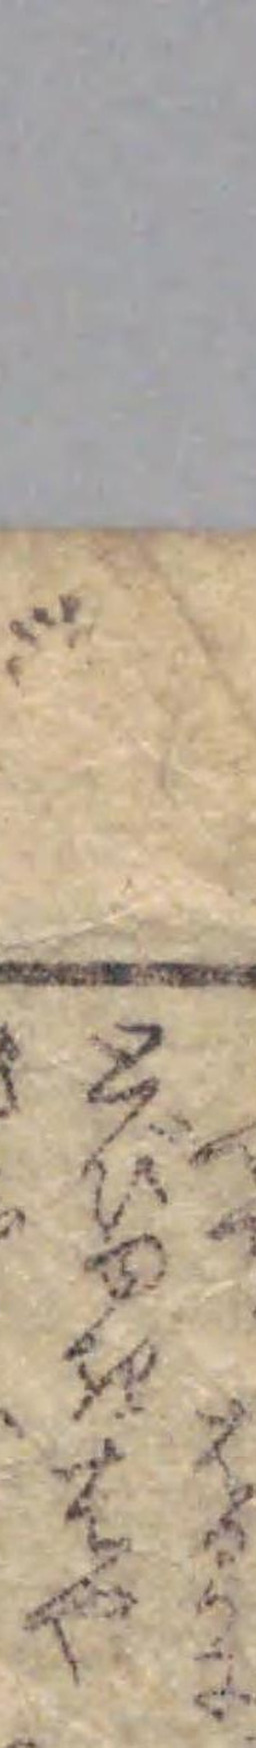とびゆきはや
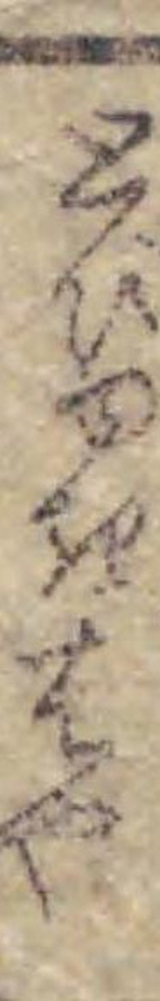とびゆきはや
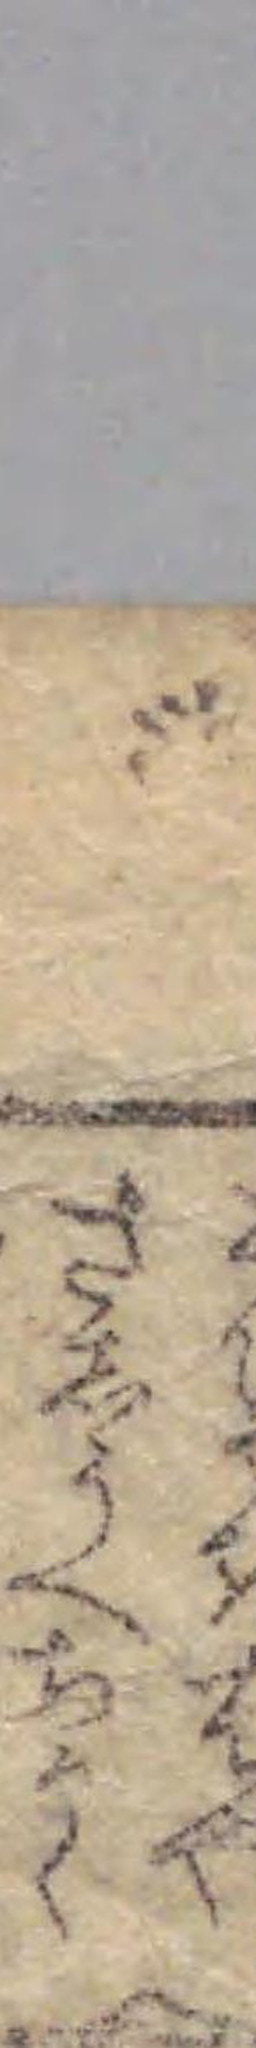さしうへちかく
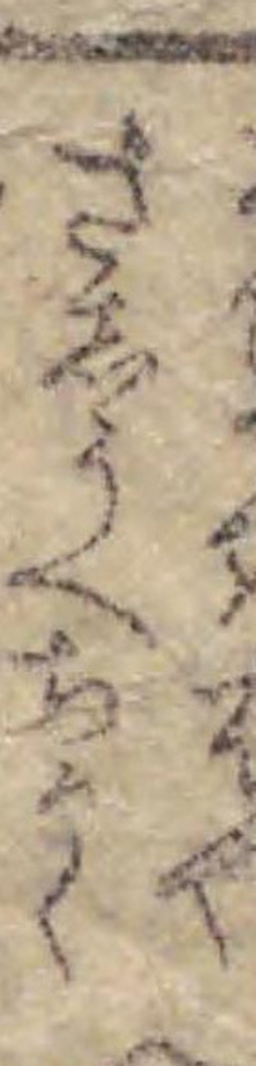さしうへちかく
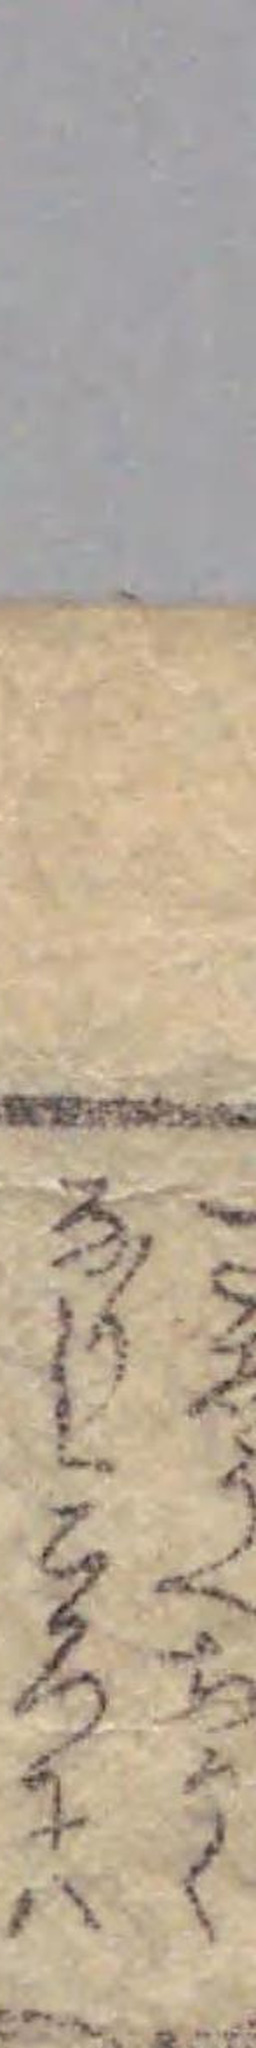なりしころには
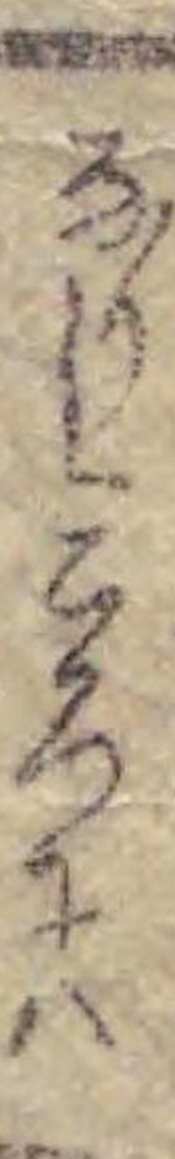なりしころには
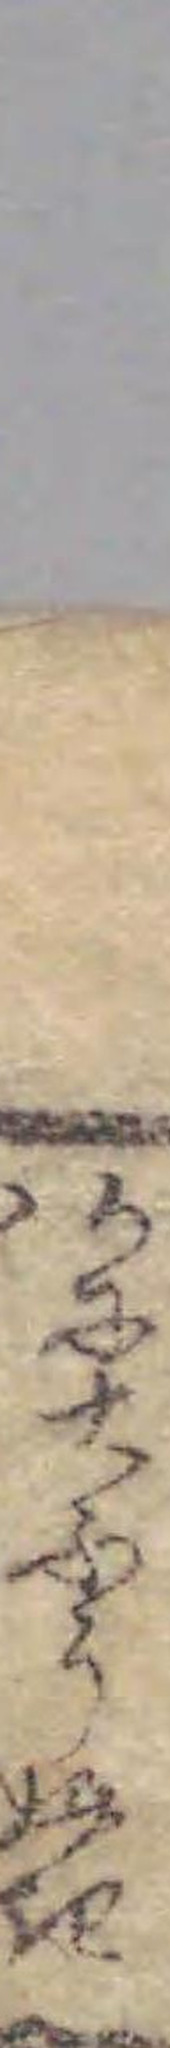かに大ふうふき
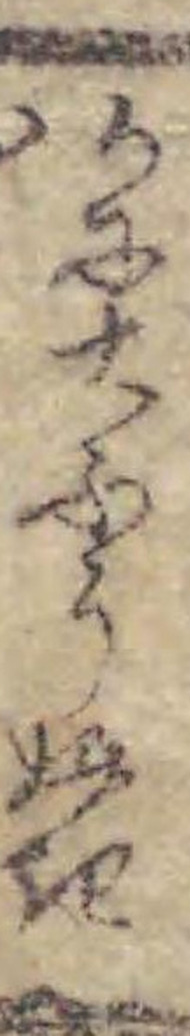かに大ふうふき
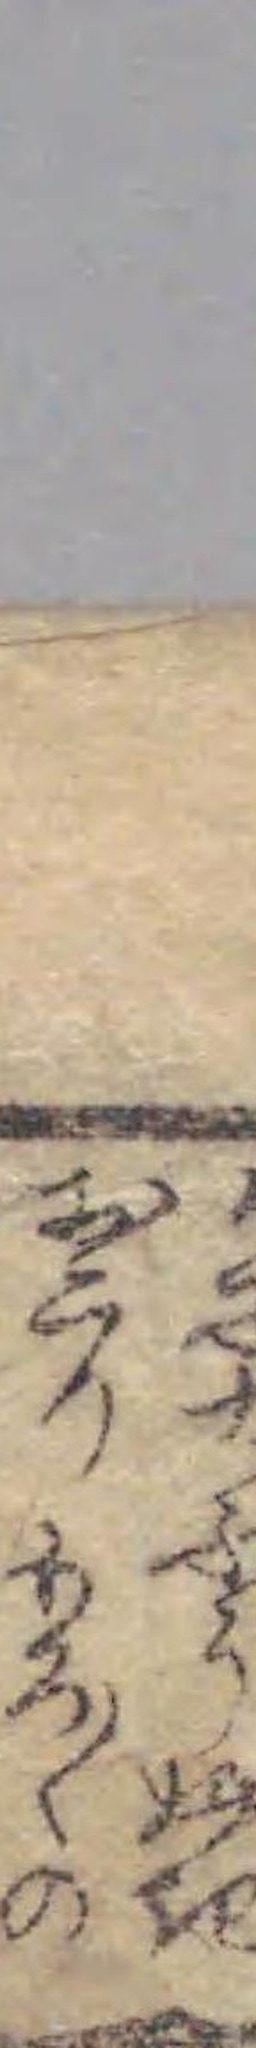おこりもろ〳〵の
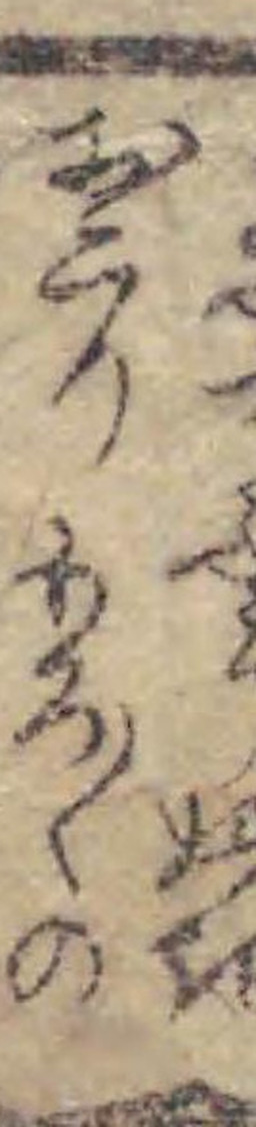おこりもろ〳〵の
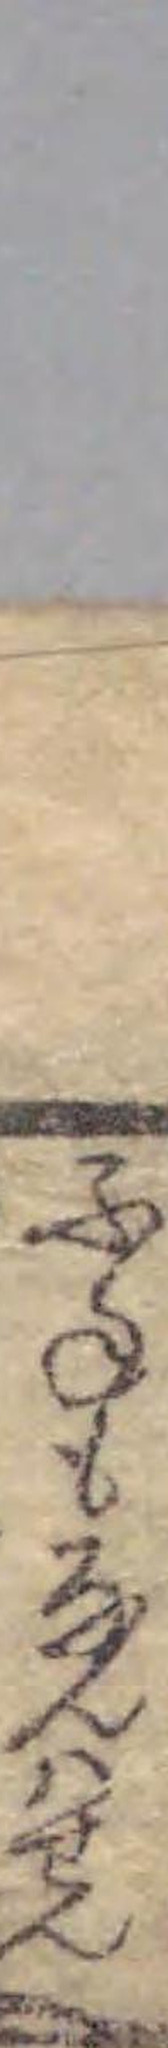ふねもなんはせん
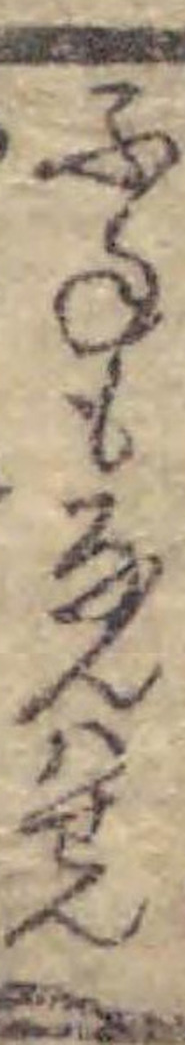ふねもなんはせん
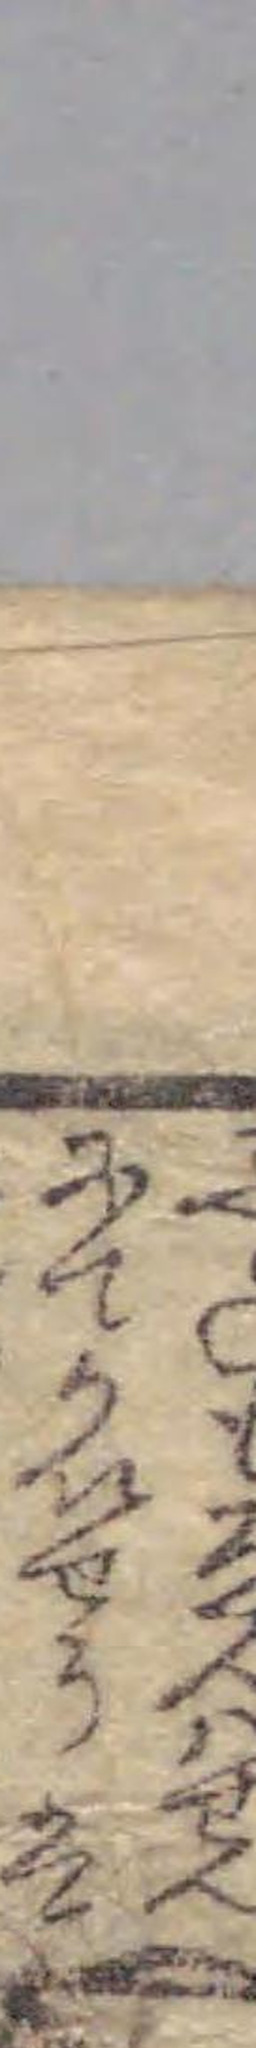にてかいせうは
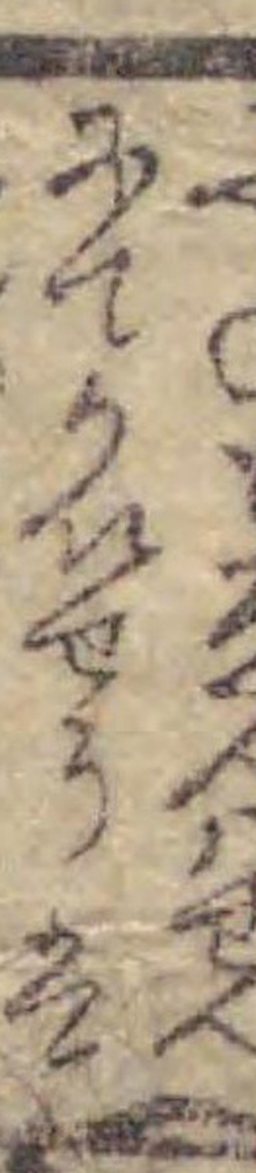にてかいせうは
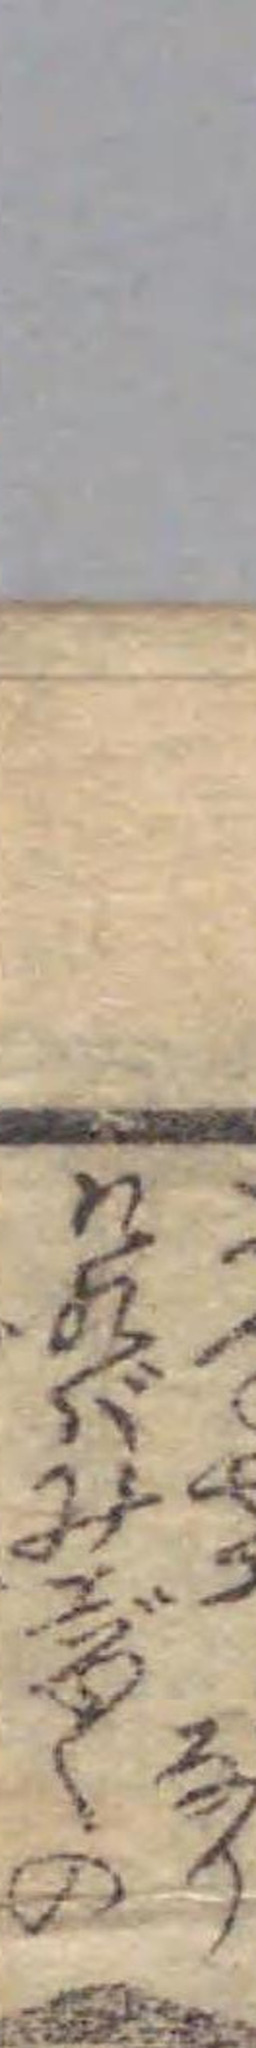ければみぢゆくの
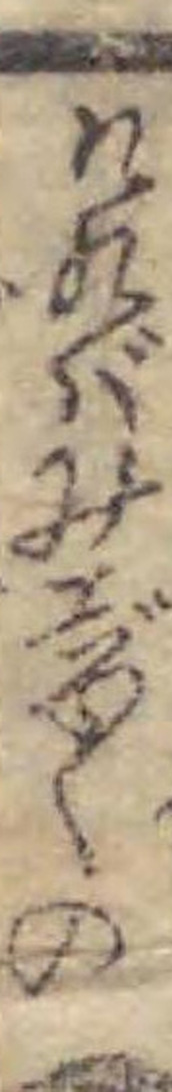ければみぢゆくの
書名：化物世界夜半嵐 : 3巻
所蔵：国立国会図書館 National Diet Library, JAPAN
